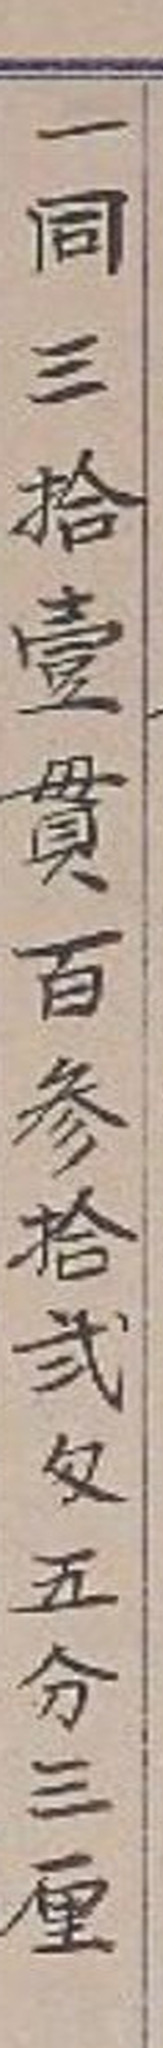一同三拾壹貫百参拾弐匁五分三厘
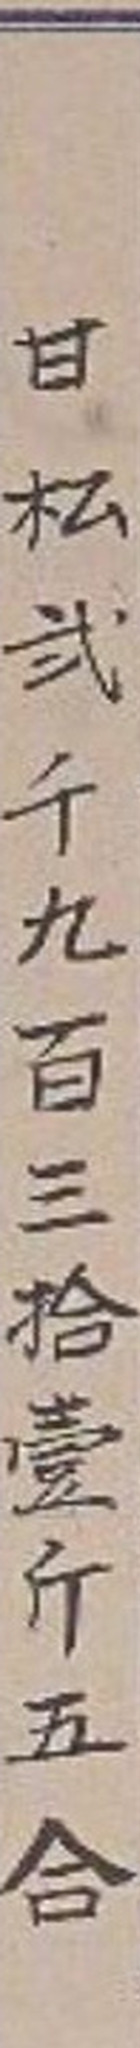甘松弐千九百三拾壹斤五合
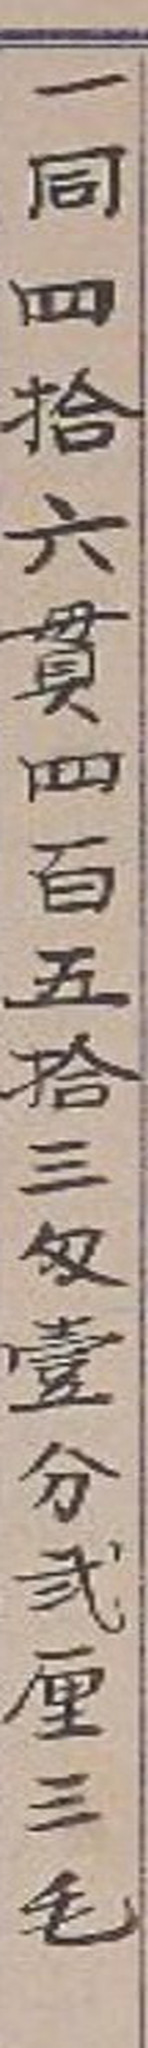一同四拾六貫四百五拾三匁壹分弐厘三毛
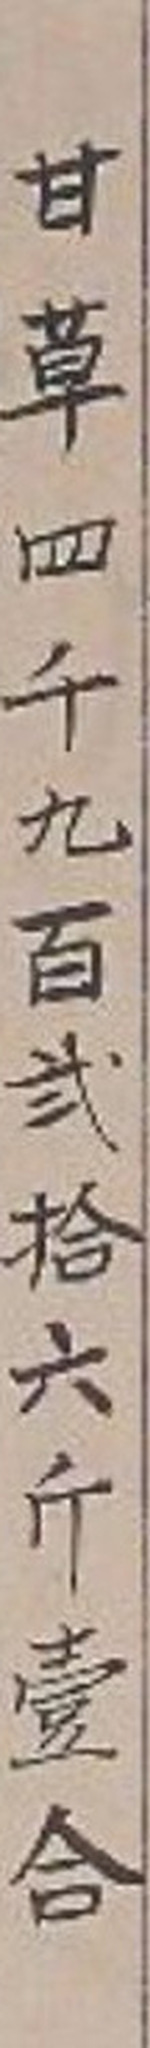甘草四千九百弐拾六斤壹合
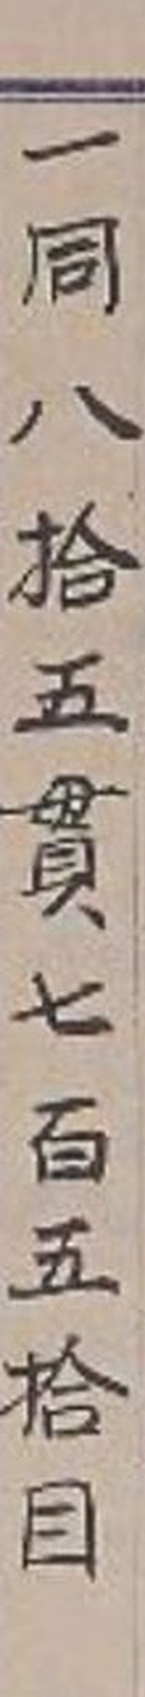一同八拾五貫七百五拾目
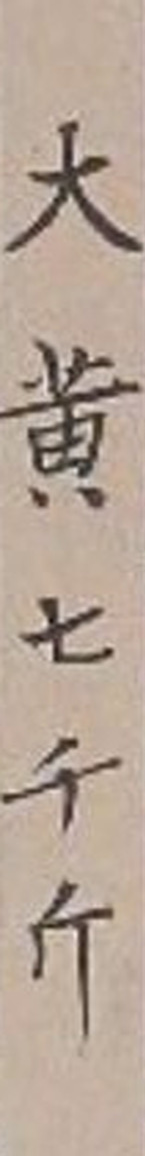大黄七千斤
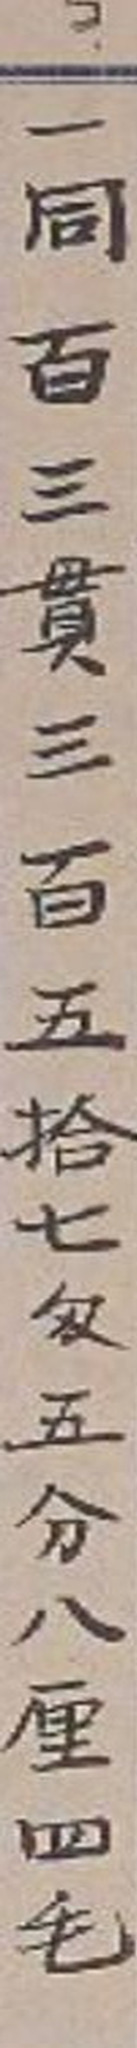一同百三貫三百五拾七匁五分八厘四毛
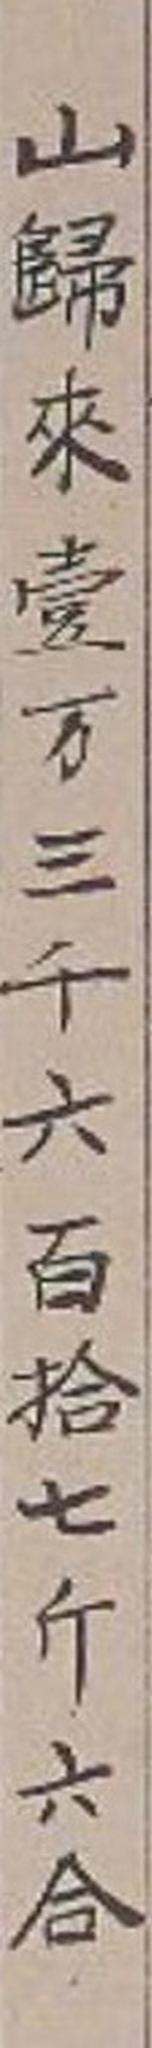山歸來壹万三千六百拾七斤六合

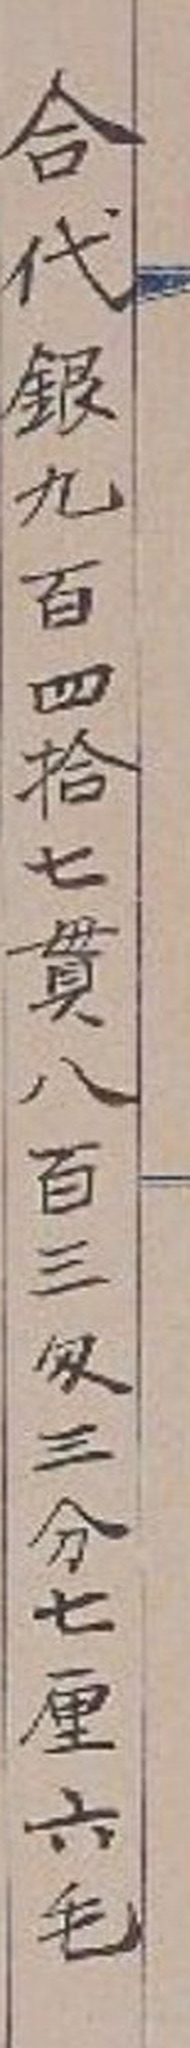合代銀九百四拾七貫八百三匁三分七厘六毛
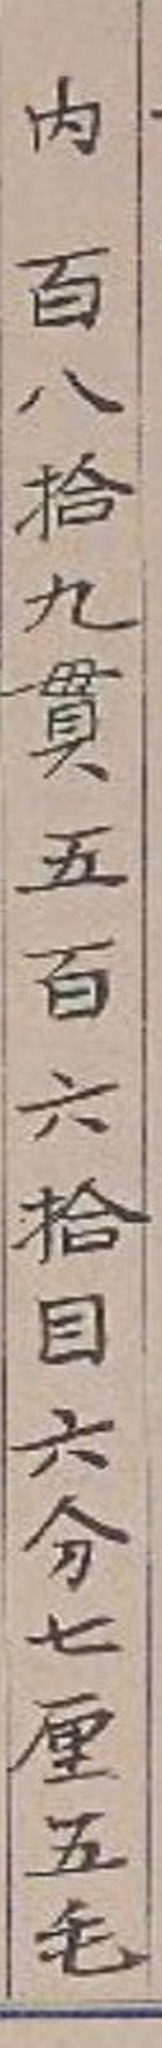内百八拾九貫五百六拾目六分七厘五毛
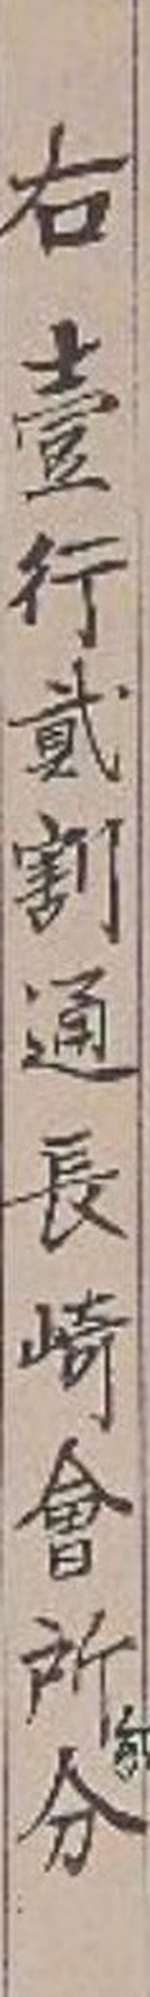右壹行貳割通長崎會所納分
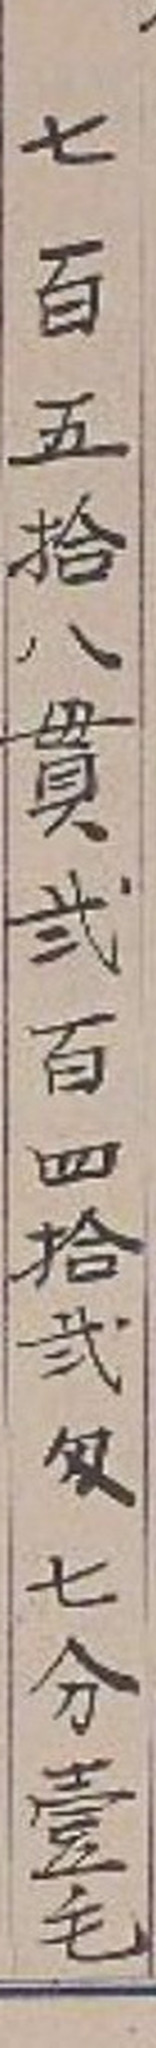七百五拾八貫弐珀百四拾弐匁七分壹毛
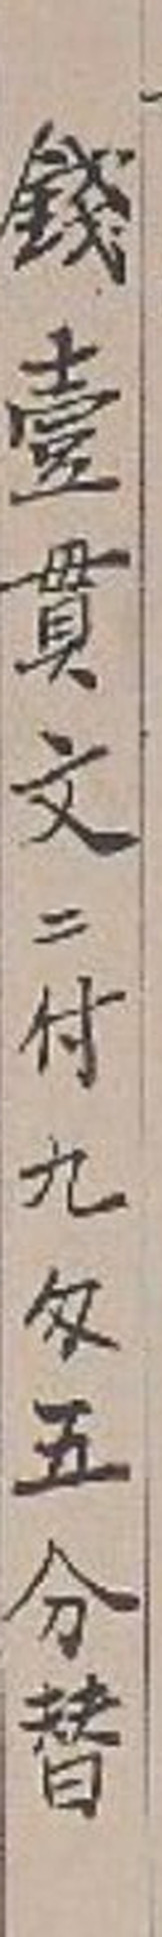錢一壹貫文ニ付九匁五分替
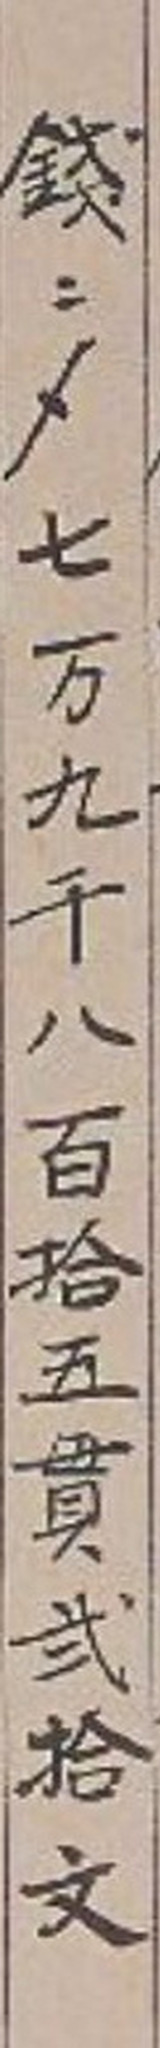錢ニシテ七万九千八百拾五貫弐拾文
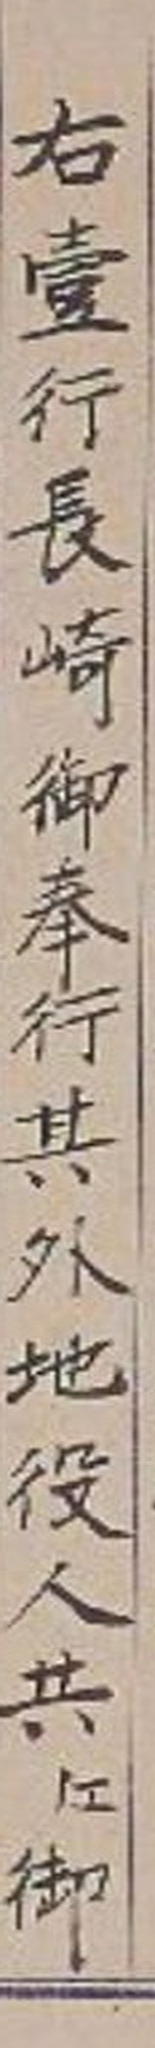右壹行長崎御奉行其外地役人共江御
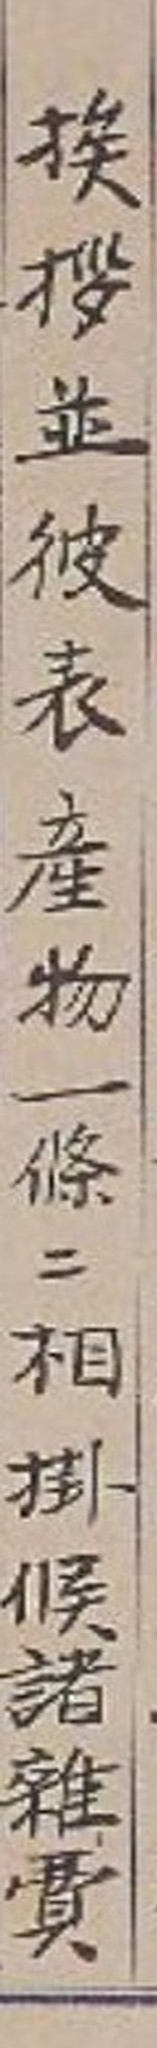挨拶並彼表産物一條ニ相掛候諸雜費
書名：琉球産物於長崎拂立並本手品利潤総帖 弘化四年より酉年迄
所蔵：University of the Ryukyus Library
